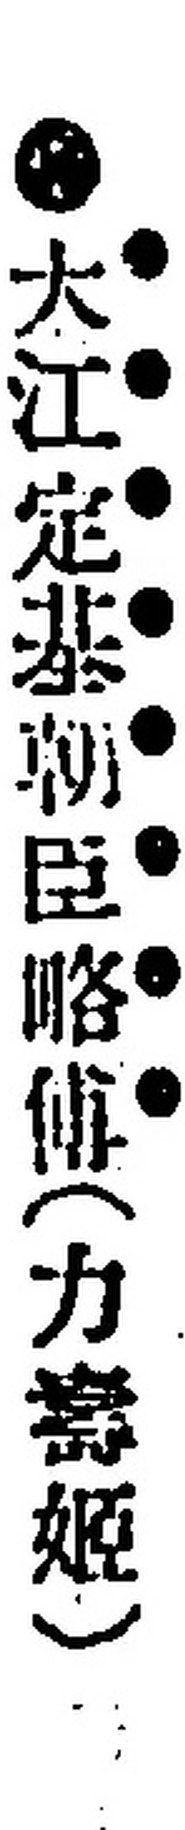●大江定基朝臣略伝(力寿姫)
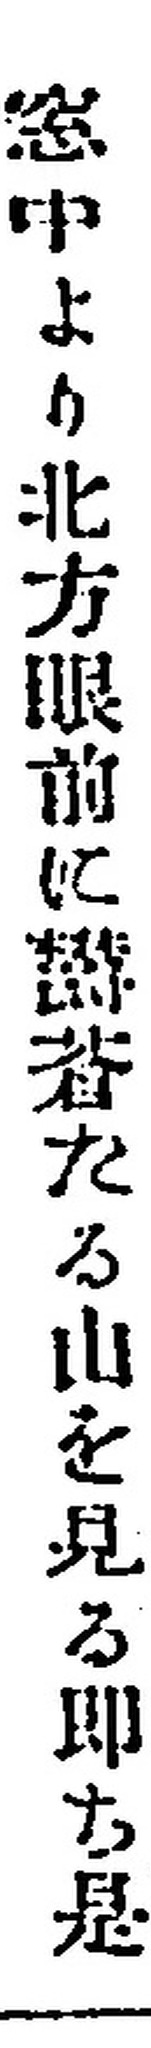窓中より北方眼前に鬱蒼たる山を見る即ち是
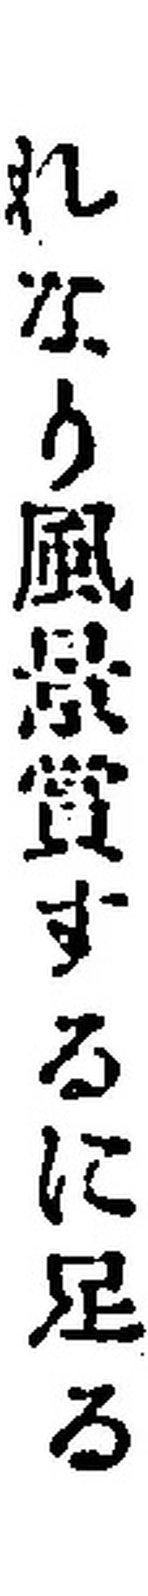れなり風景賞するに足る
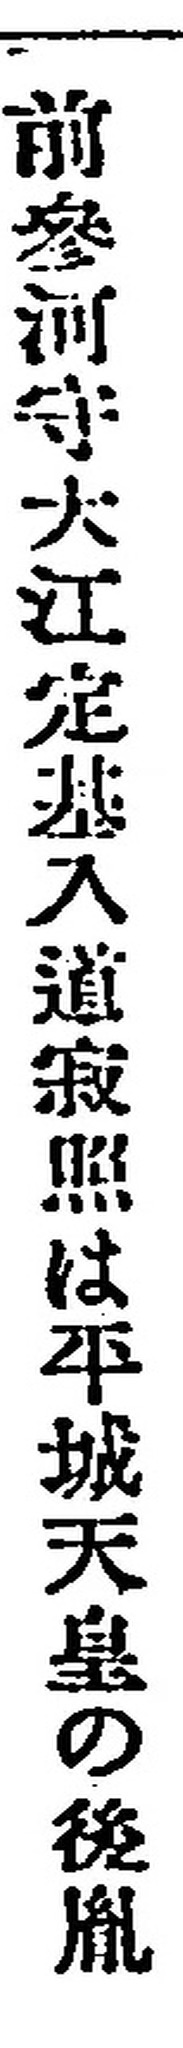前参河守大江定基入道寂照は平城天皇の後胤
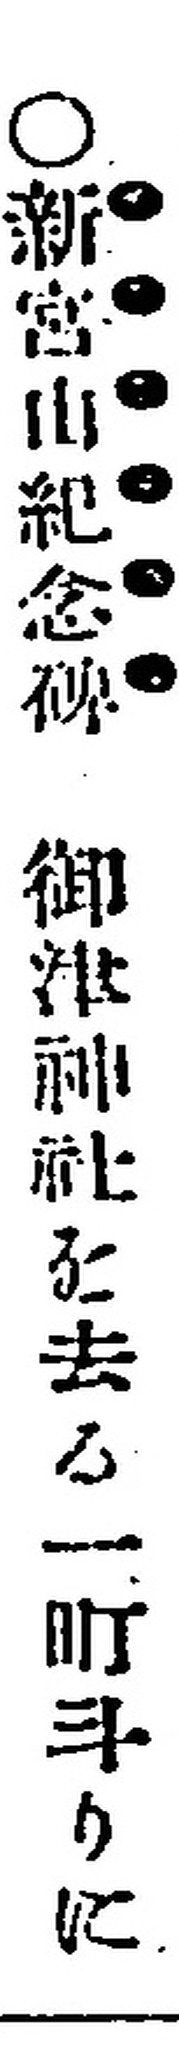○新宮山紀念碑御津神社を去る一町斗りに
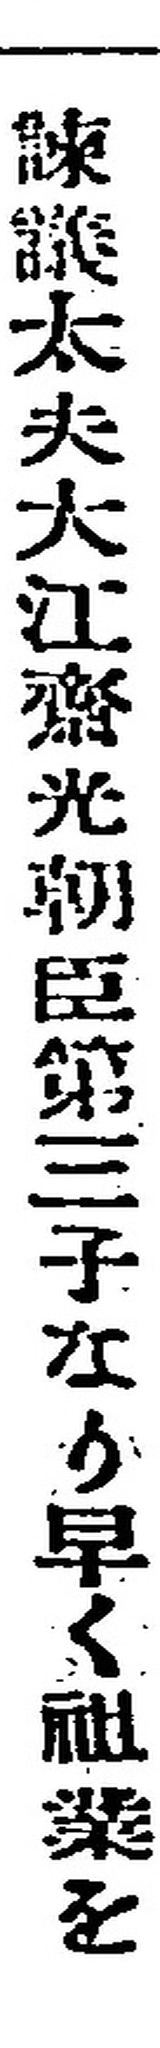諫議太夫大江齋光朝臣第三子なり早く祖業を
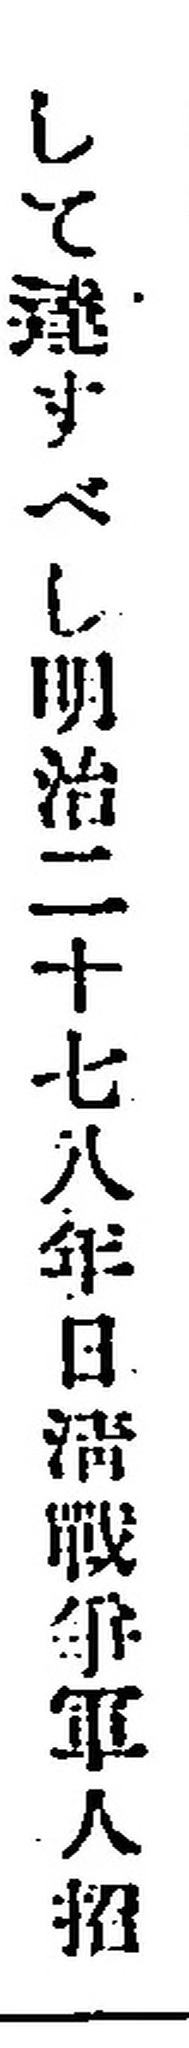して達すべし明治二十七八年日清戦争軍人招
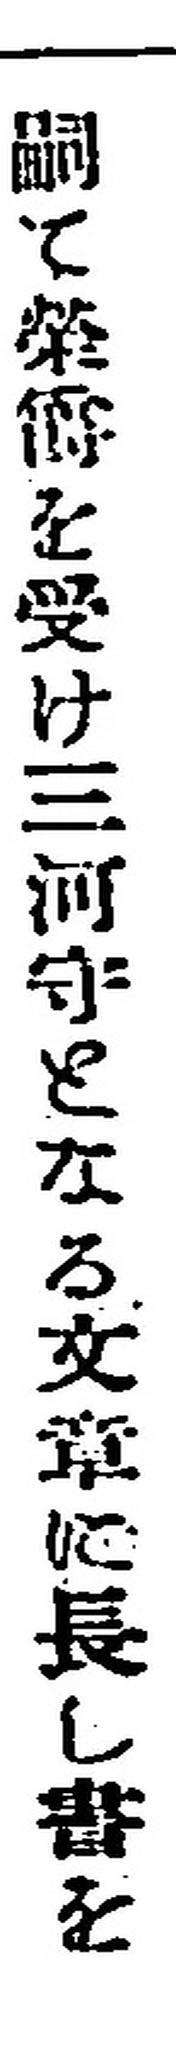嗣て栄爵を受け三河守となる文章に長し書を
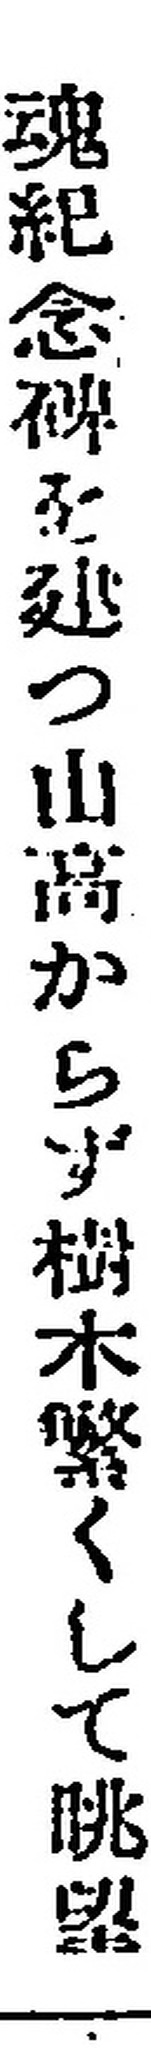魂紀念碑を建つ山高からず樹木繁くして眺望
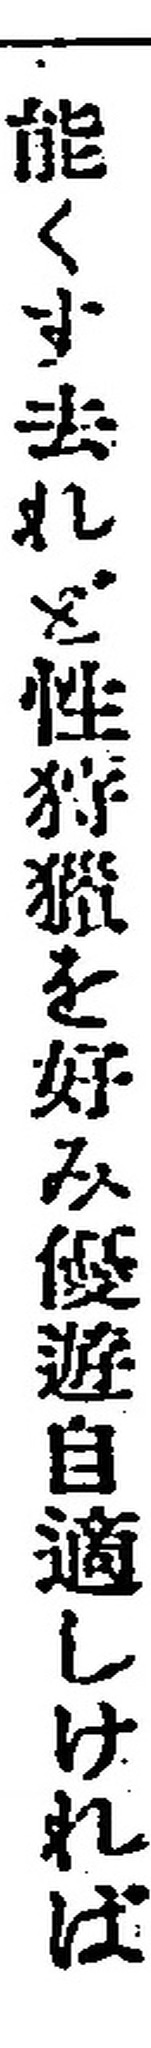能くす去れど性狩猟を好み優遊自適しければ
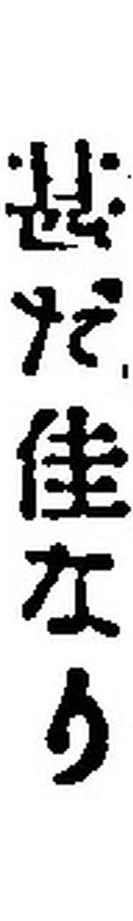甚だ佳なり
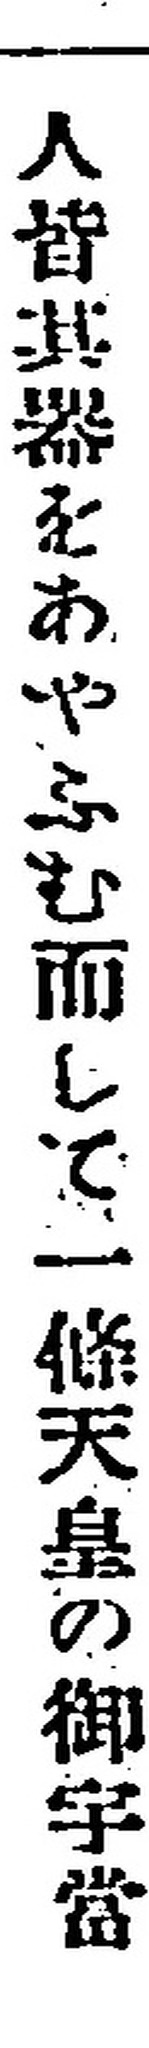人皆其器をあやふむ而して一条天皇の御宇当
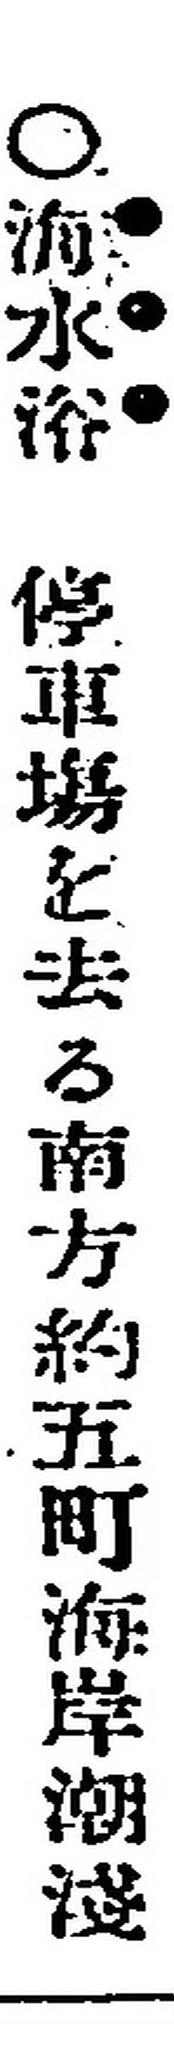○海水浴停車場を去る南方約五町海岸潮浅
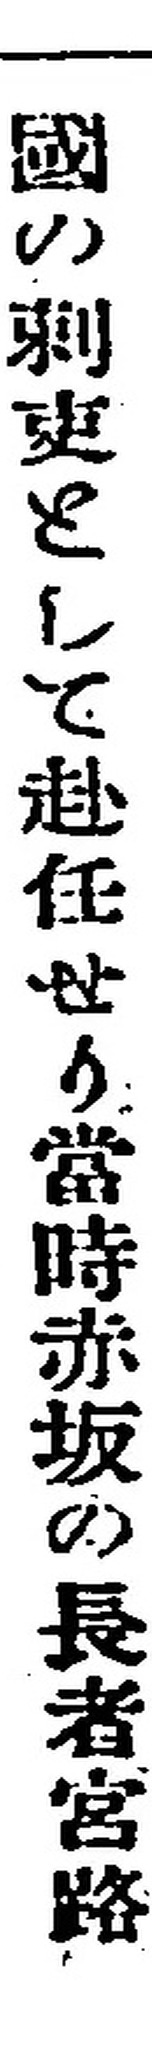国の刺吏として赴任せり当時赤坂の長者宮路
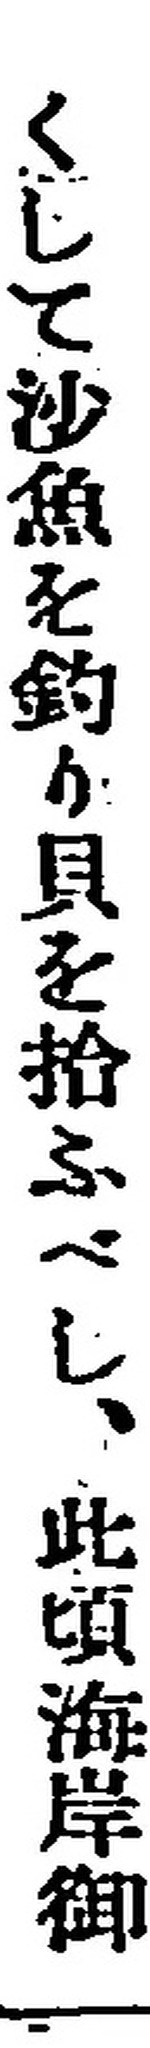くして沙魚を釣り貝を拾ふべし、此頃海岸御
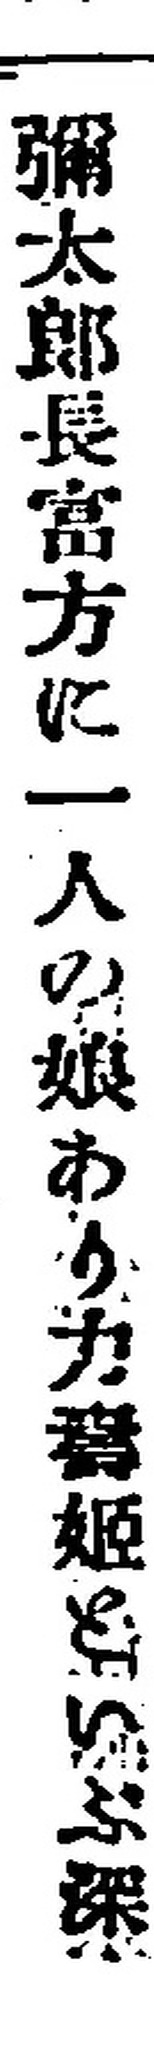弥太郎長富方に一人の娘あり力寿姫といふ深
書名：東参名勝案内
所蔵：国立国会図書館 National Diet Library, JAPAN
